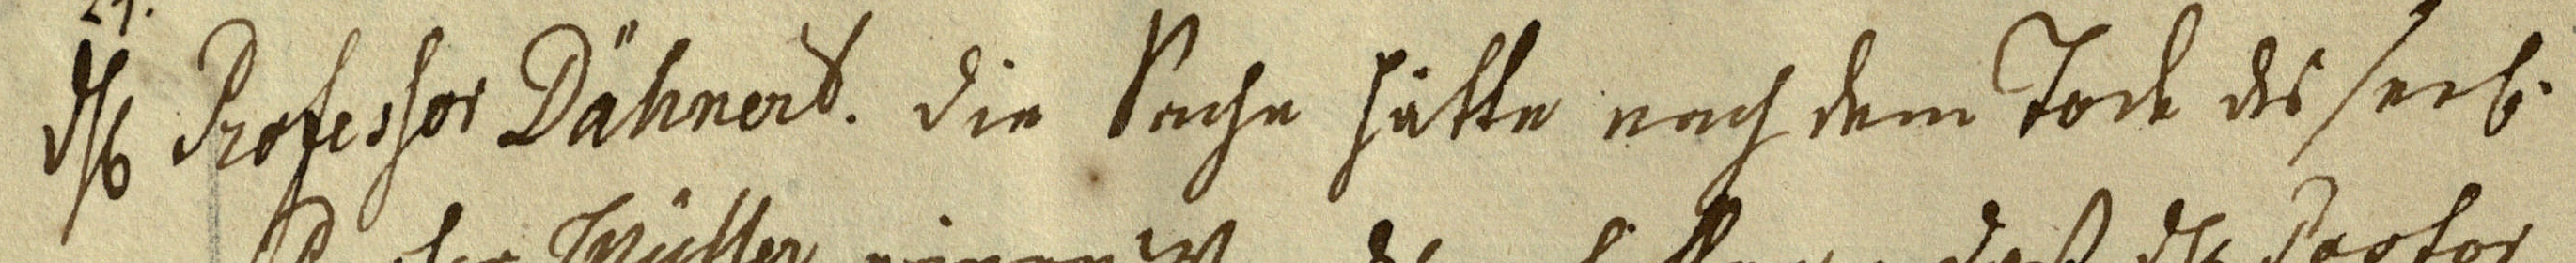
dh Professor Dähnert. die Sache hätte nach dem Tode des seel.
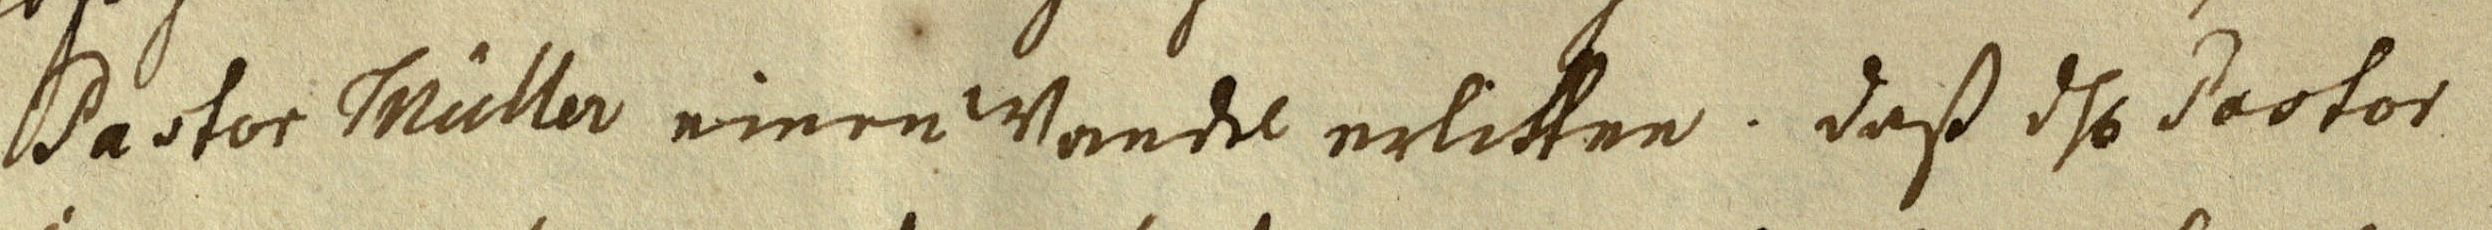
Pastor Müller einen Wandel erlitten. daß dh Pastor
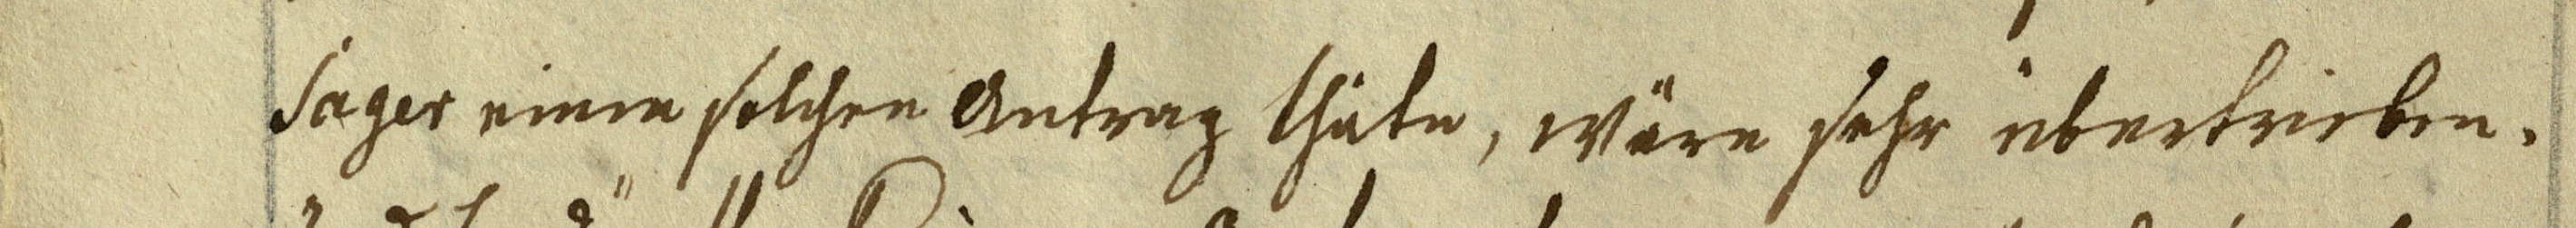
Sager einen solchen Antrag thäte, wäre sehr übertrieben
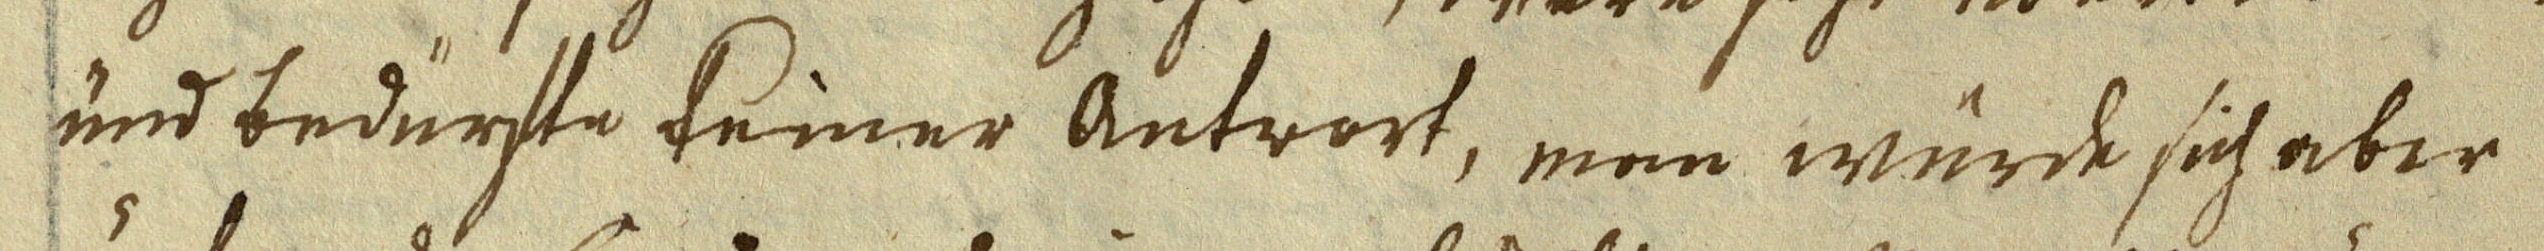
und bedürfte keiner Antwort, man würde sich aber
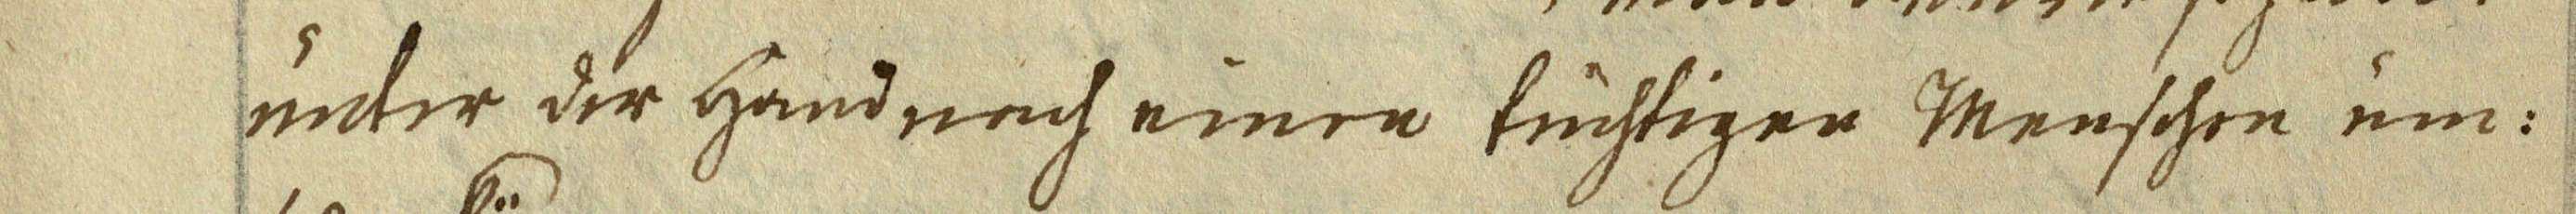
unter der Hand nach einen tüchtigen Menschen um¬
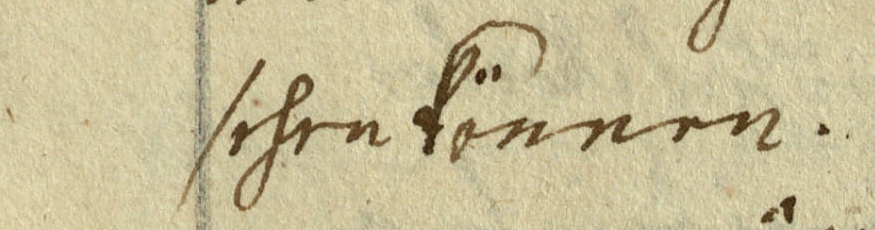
sehen können.
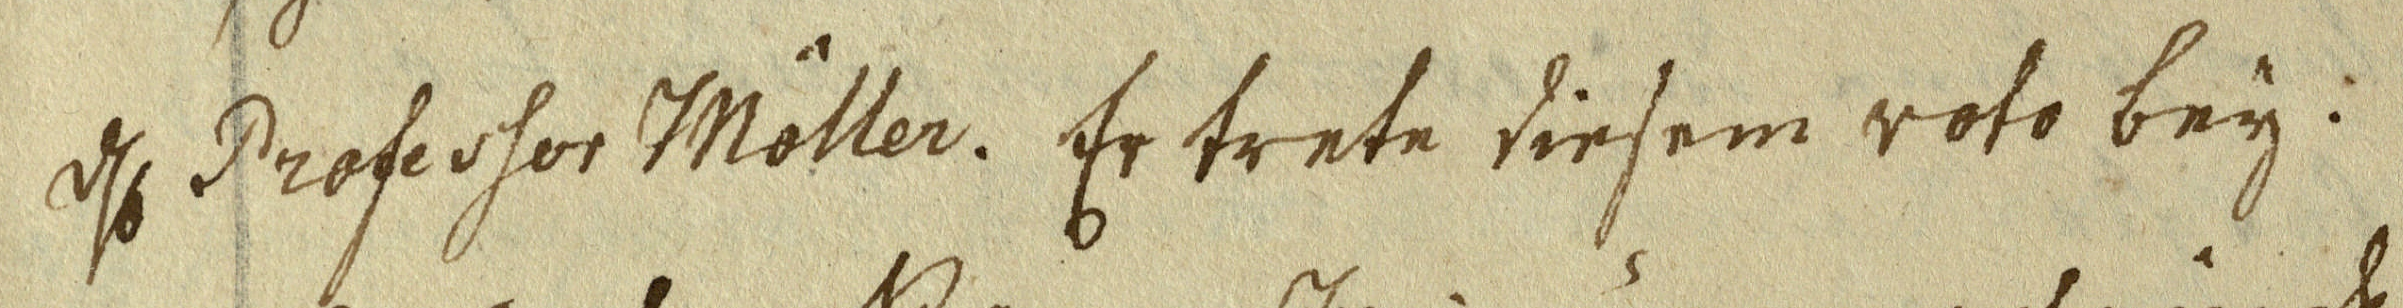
dh Professor Möller. Er trete diesem voto beÿ.
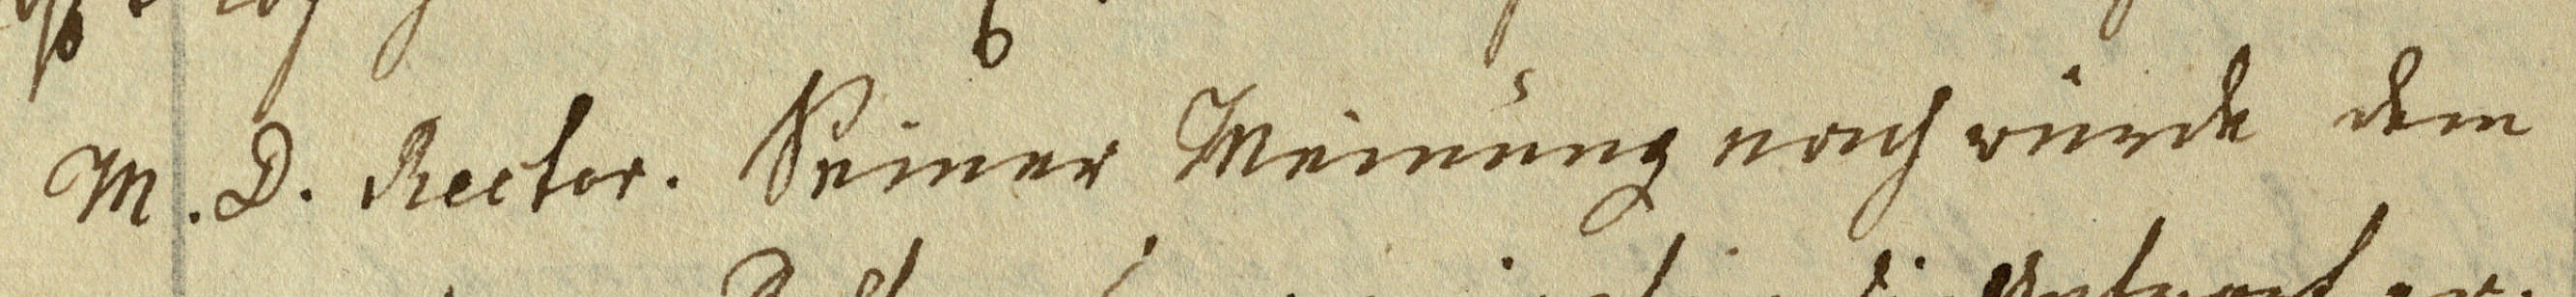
M. D. Rector. Seiner Meinung nach würde dem
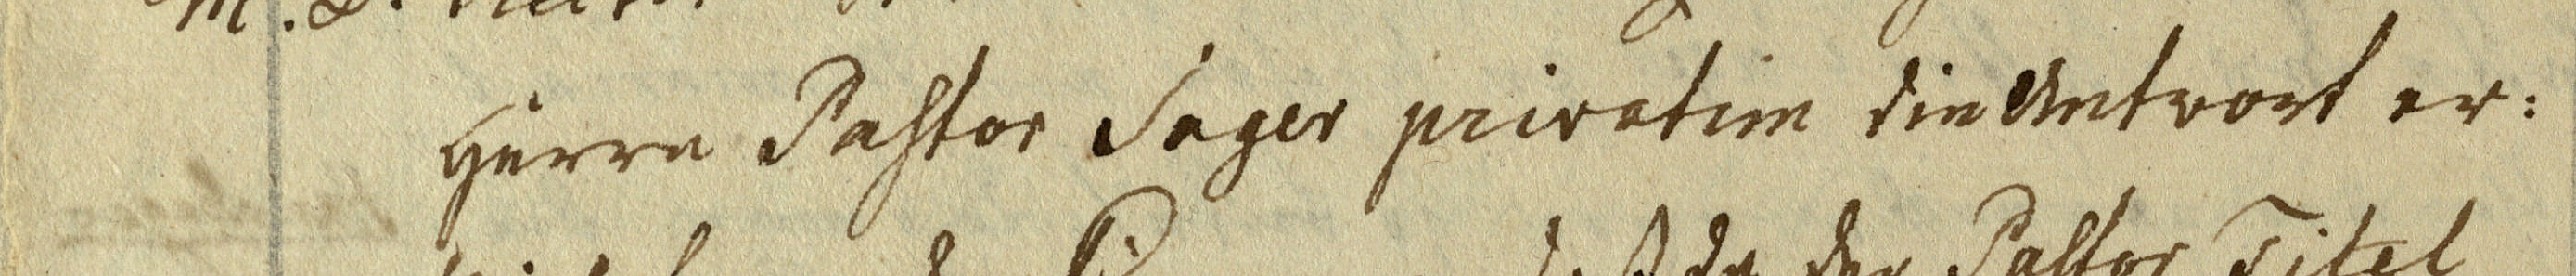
Herrn Pastor Sager privatim die Antwort er¬
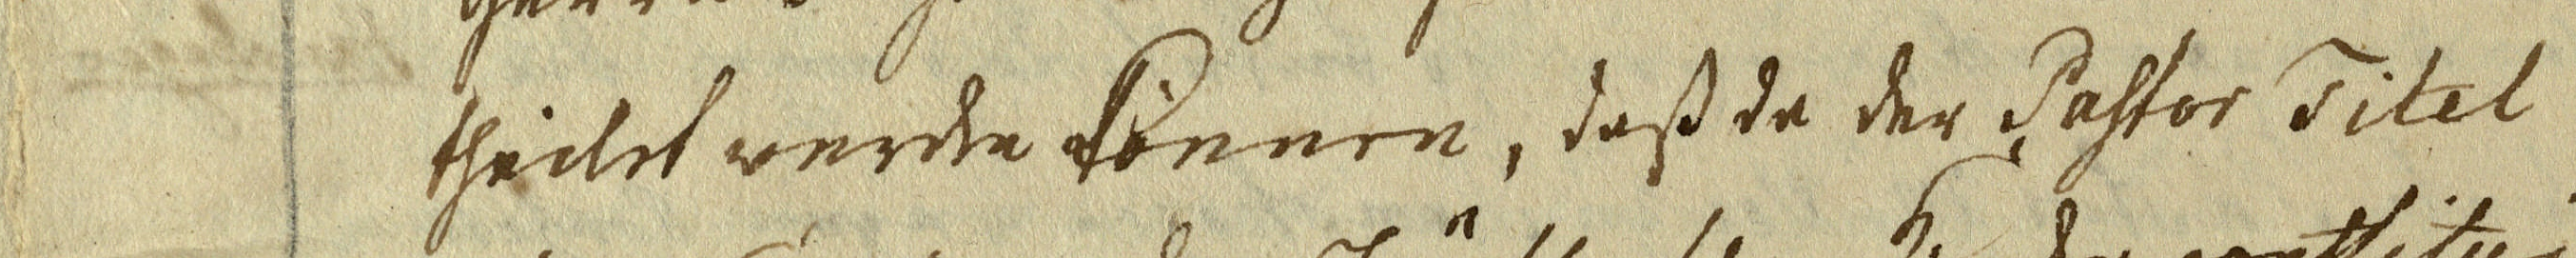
theilet werden können, daß da der Pastor Titel
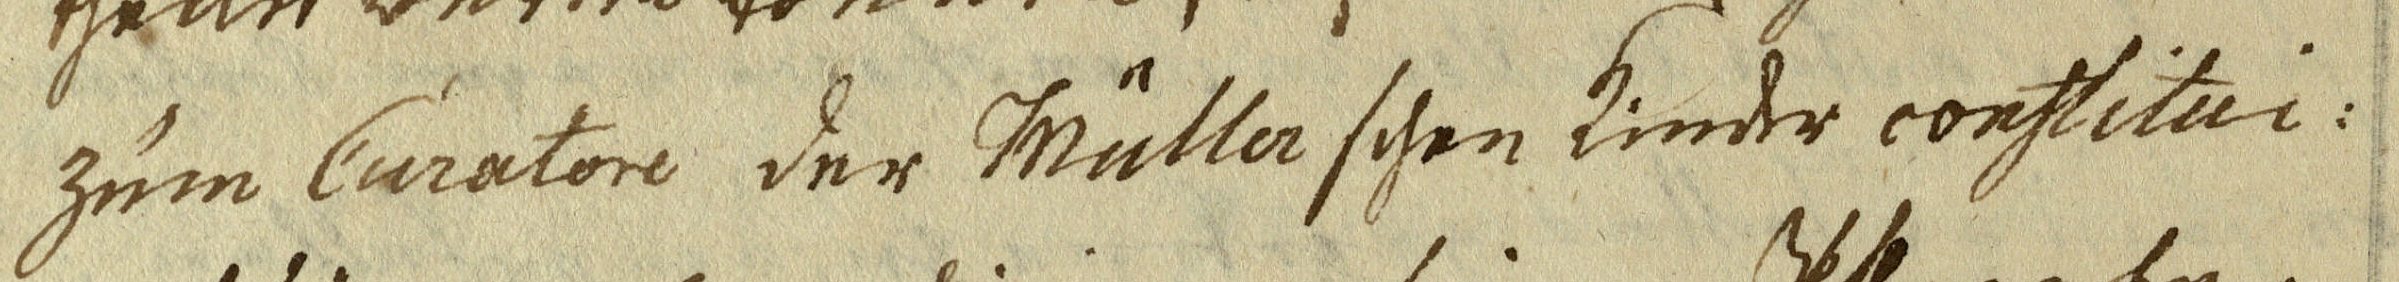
zum Curatore der Müllerschen Kinder constitui¬
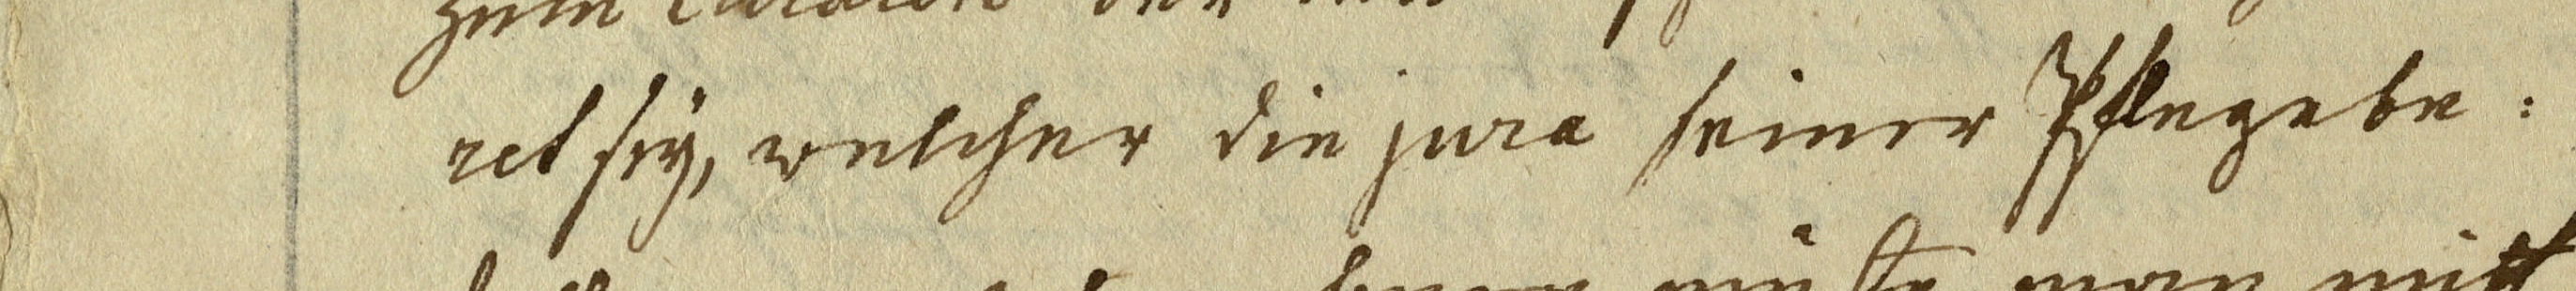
ret seÿ, welcher die jura seiner Pflegebe¬
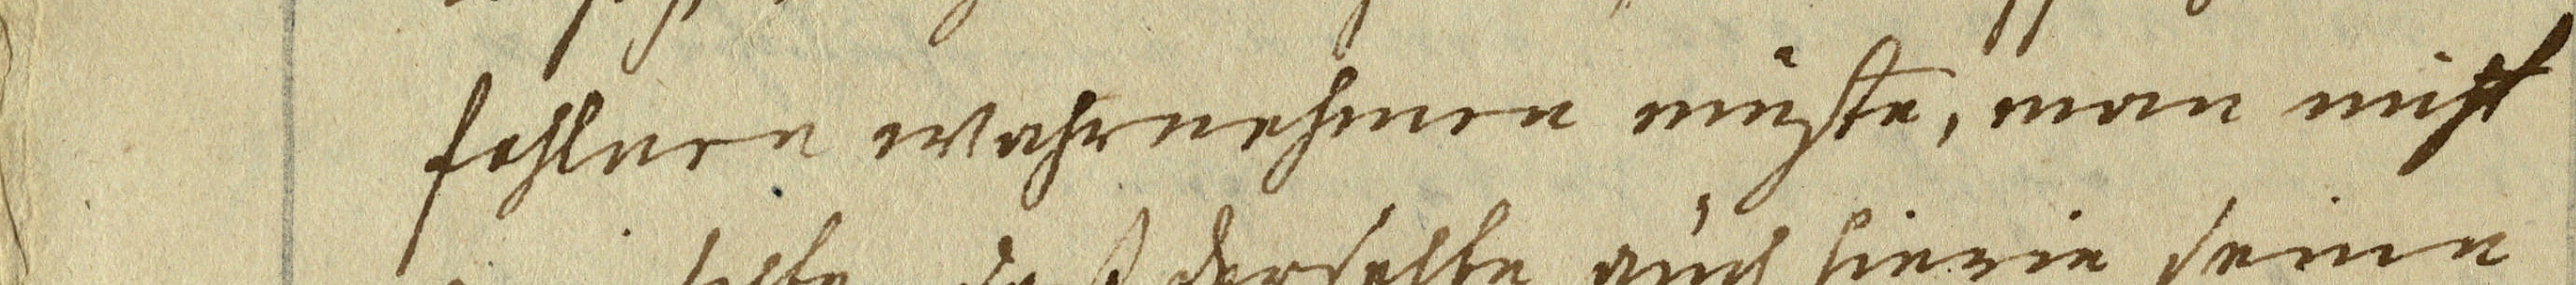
fohlnen wahrnehmen müste, man nicht
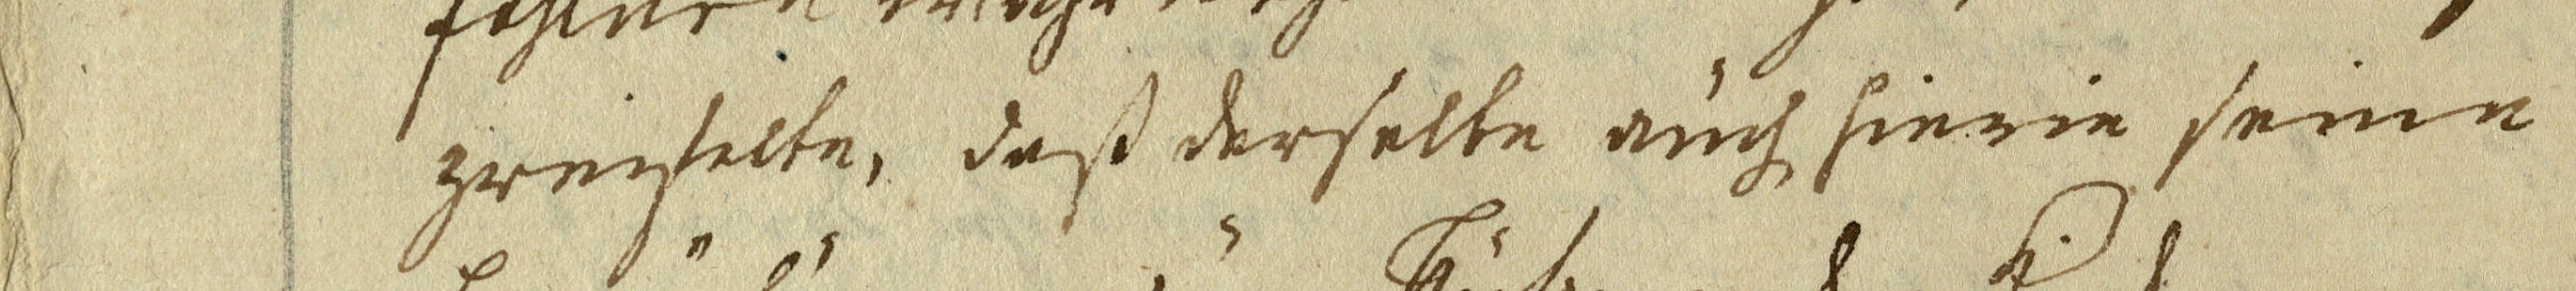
zweifelte, daß derselbe auch hierin seine
